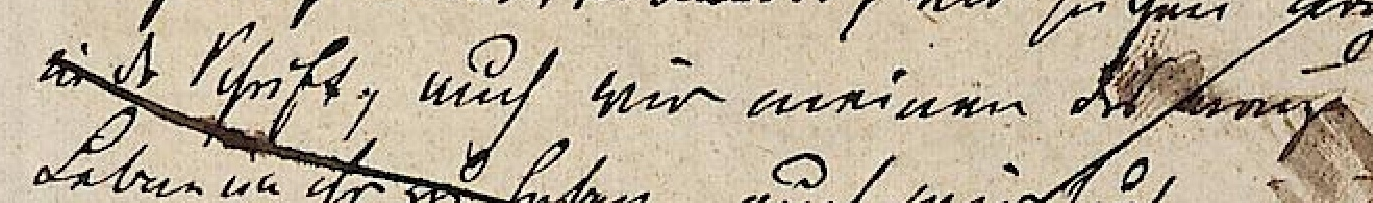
in dr Schrift, auch wir meinen ds ewige
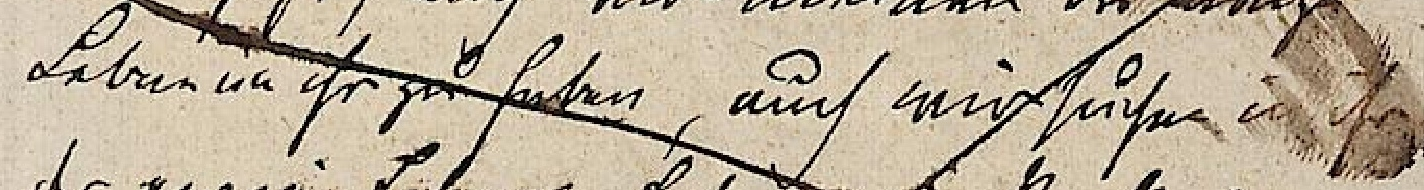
Leben an ihr zu haben, auch wir suchen in ihr
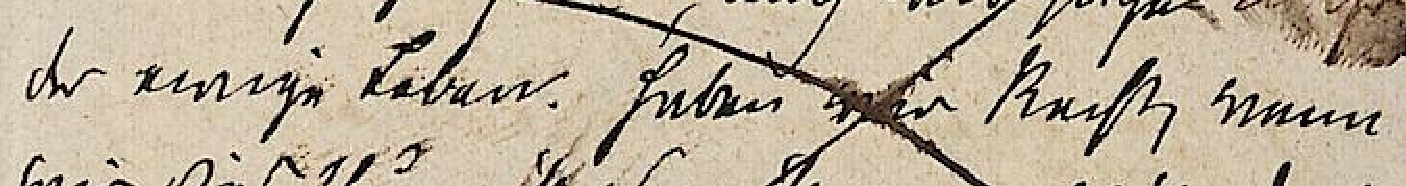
ds ewige Leben. haben wir Recht, wenn
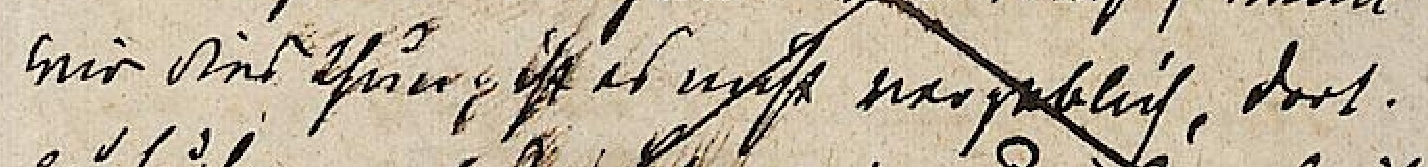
wir dies thun, ist es nicht vergeblich, dort.
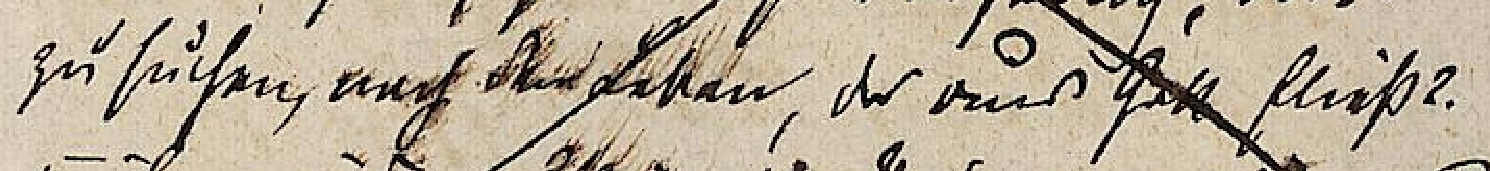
zu suchen, nach dem Leben, das aus Gott fließt.
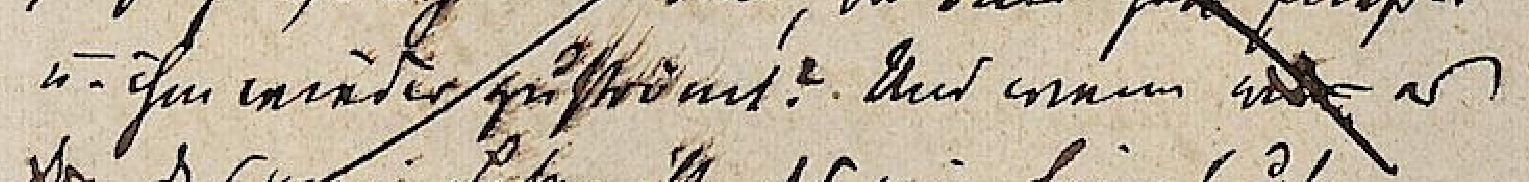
u. ihm wieder zuströmt? Und wenn wir es
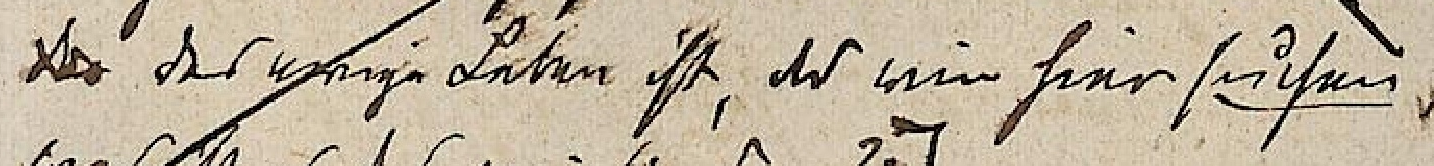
der das ewige Leben ist, das wir hier suchen,
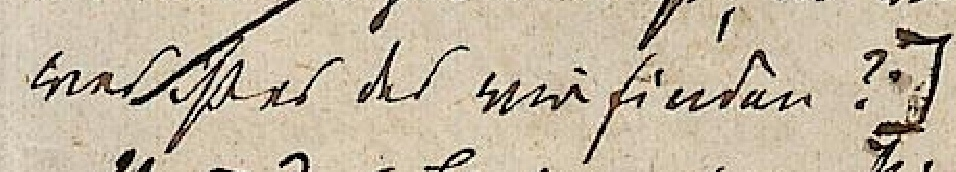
was ist es das wir finden)]
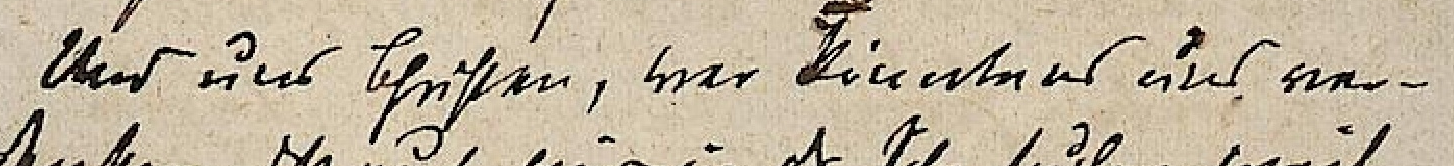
Und uns Christen, wer könnte es uns ver¬
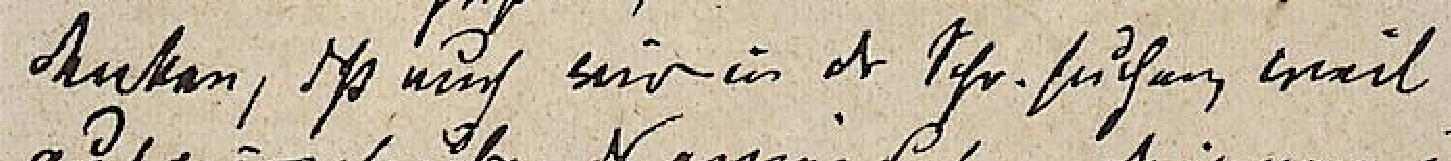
denken, dß auch wir in dr. Schr. suchen, weil
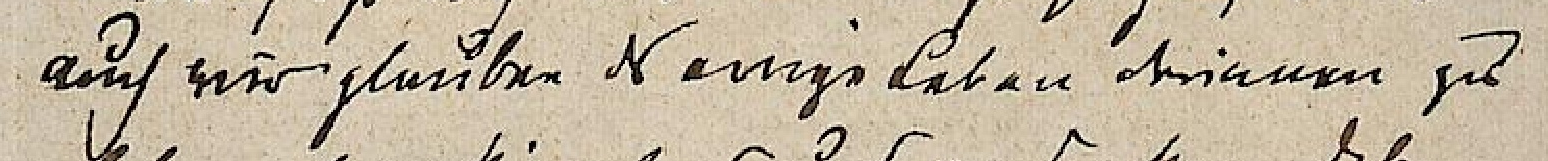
auch wir glauben ds ewige Leben darinnen zu
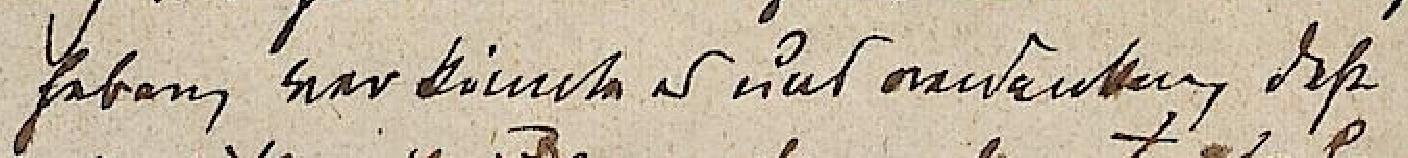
haben, wer könnte es uns verdenken, daß
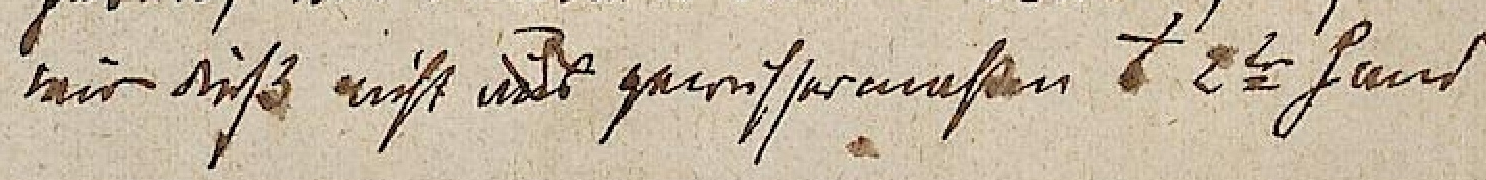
wir dieses nicht aus gewissermaßen s 2ter Hand
